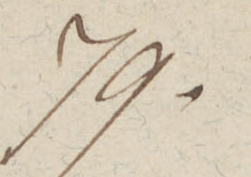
79.
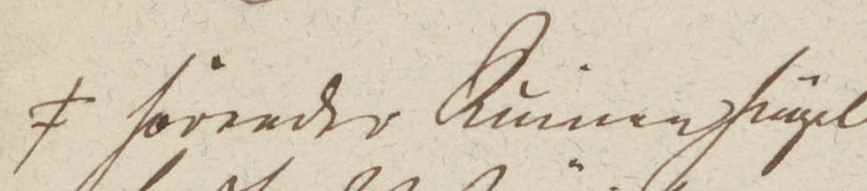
% hörender Ruinenhügel
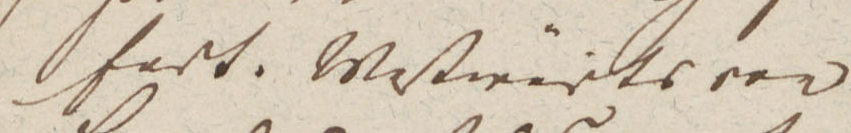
fort. Westwärts von
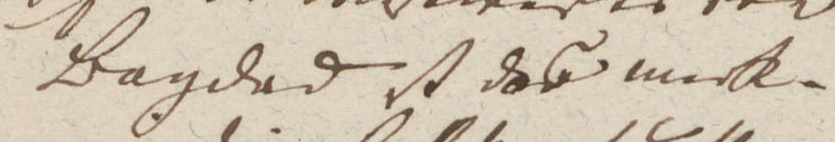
Bagdad ist deras merk-
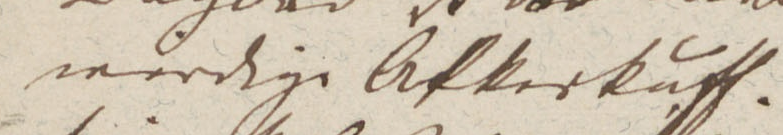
würdige Akkerkuff.
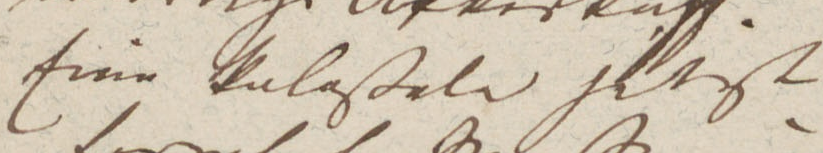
Eine kolossale jetzt
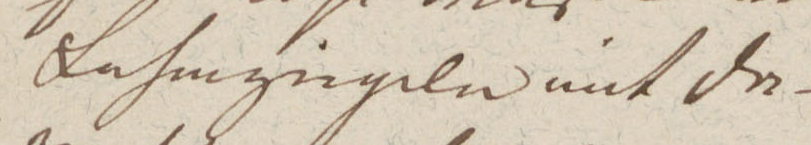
Lehmziegeln mit da-
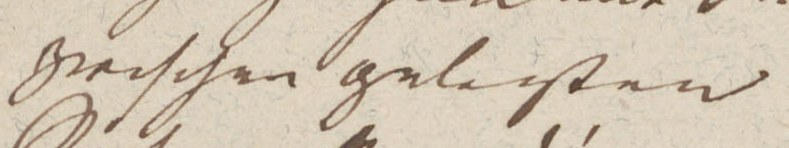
zwischen gelegten
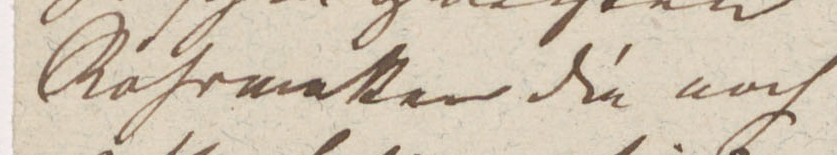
Rohrmatten die noch
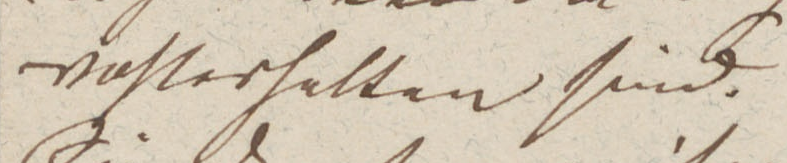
wohlerhalten sind.
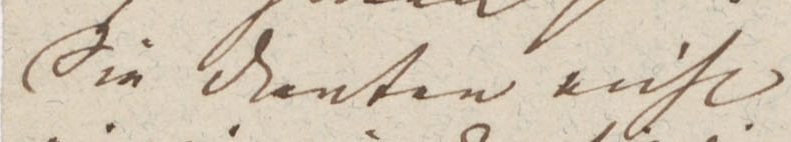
Sie dienten nicht
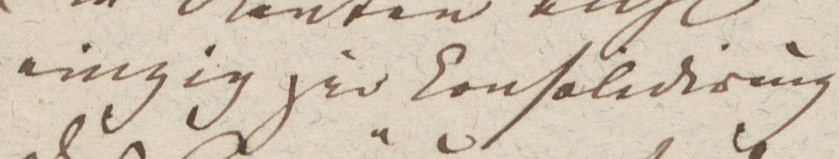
einzig zur Consolidirung
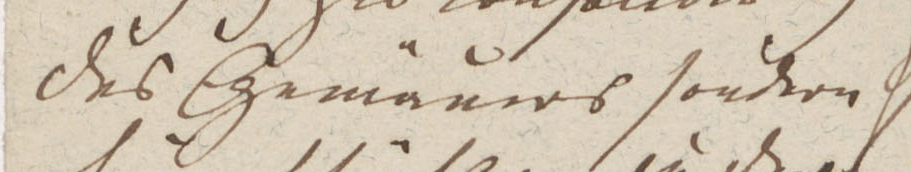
des Gemäuers sondern
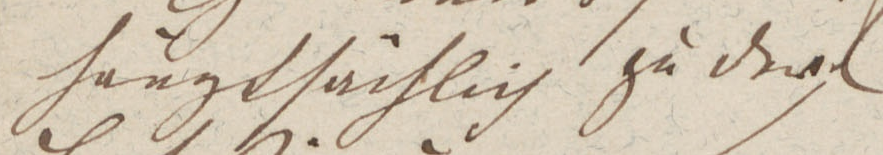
hauptsächlich zu der
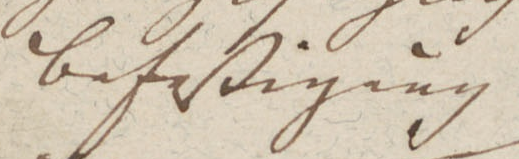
Befestigung
